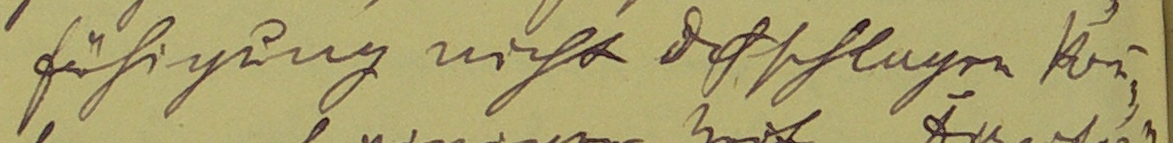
fähigung nicht dchschlagen konn¬
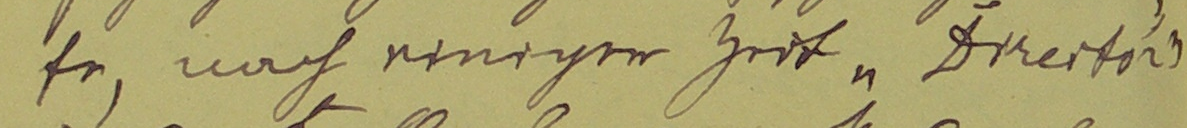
te, nach einiger Zeit „ ??? “
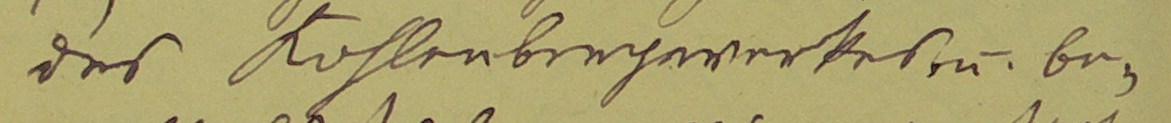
des Kohlenbergwerkes u. be¬
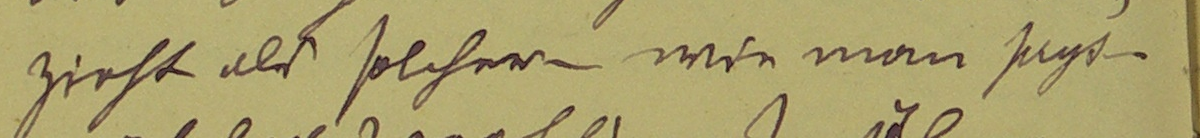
zieht als solcher - wie man sagt -
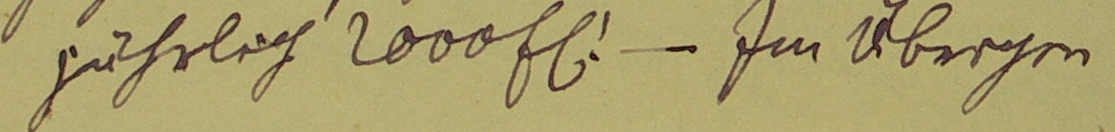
jährlich 2000 fl !.- Im Übrigen
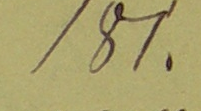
181
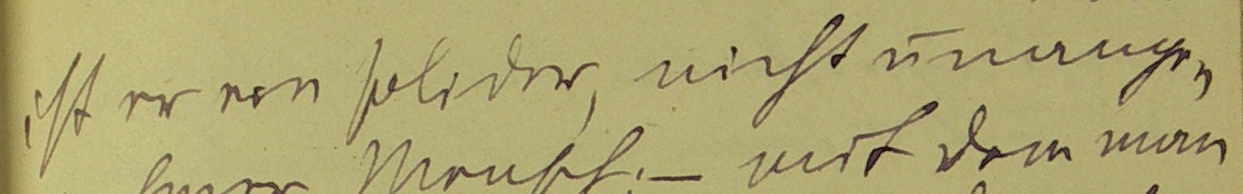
ist er ein solider, nicht unange¬
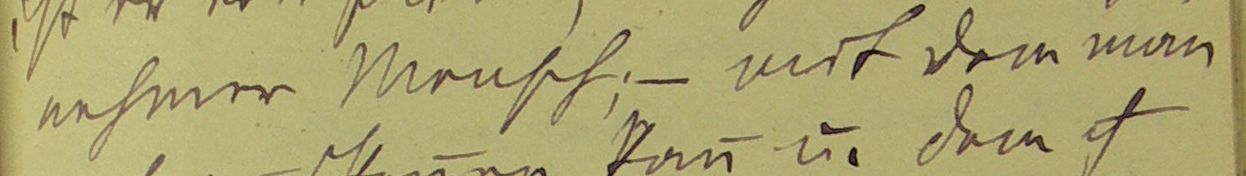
nehmer Mensch;-- mit dem man
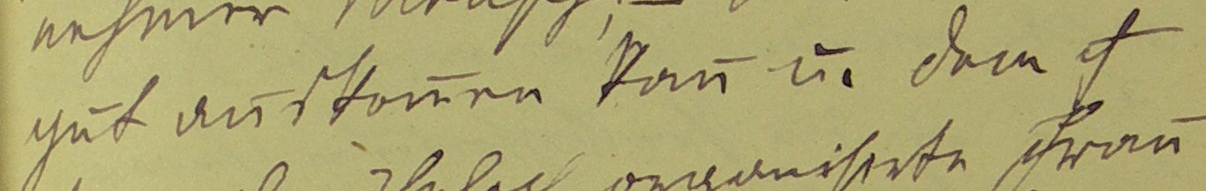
gut auskommen kann u. dem ch
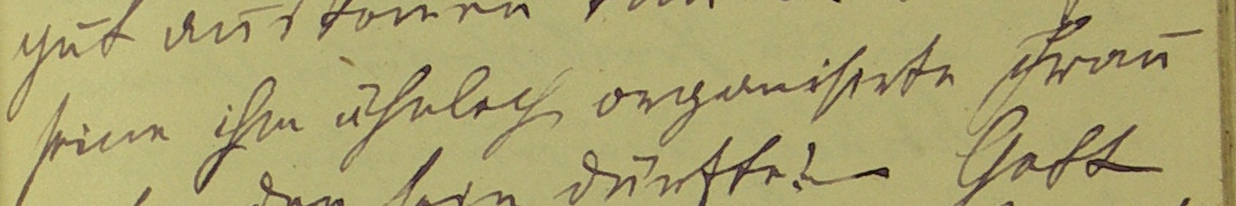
seine ihm ähnlich organisierte Frau
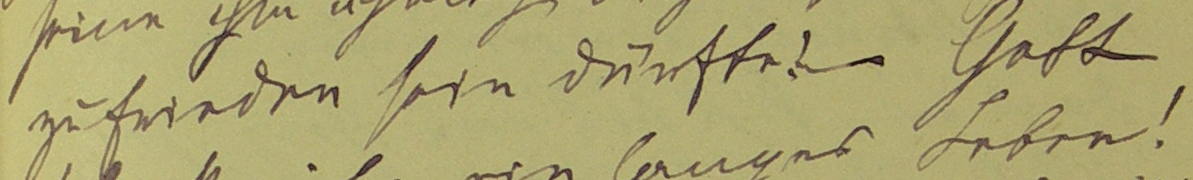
zufrieden sein dürfte!-- Gott
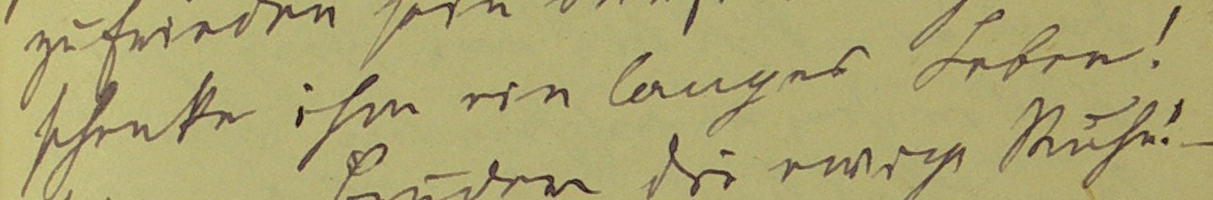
schenke ihm ein langes Leben!
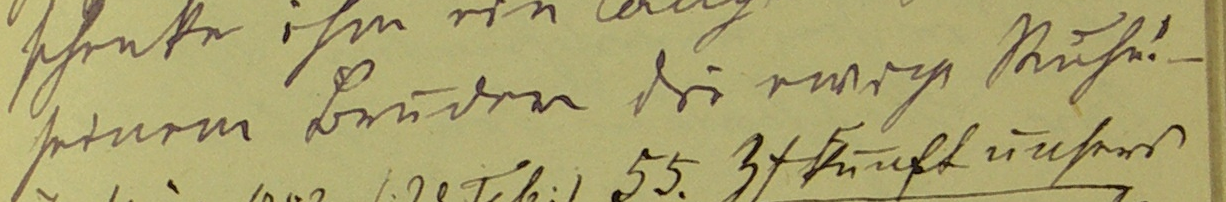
Seinem Bruder die ewige Ruhe! -
